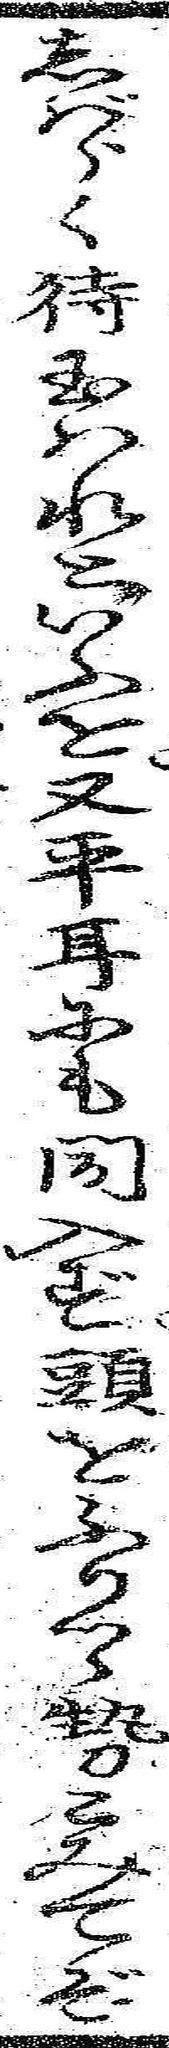しばらく待玉はれといふを。又平耳にも聞入ず。頭をふりつゝ勢こみてぞ
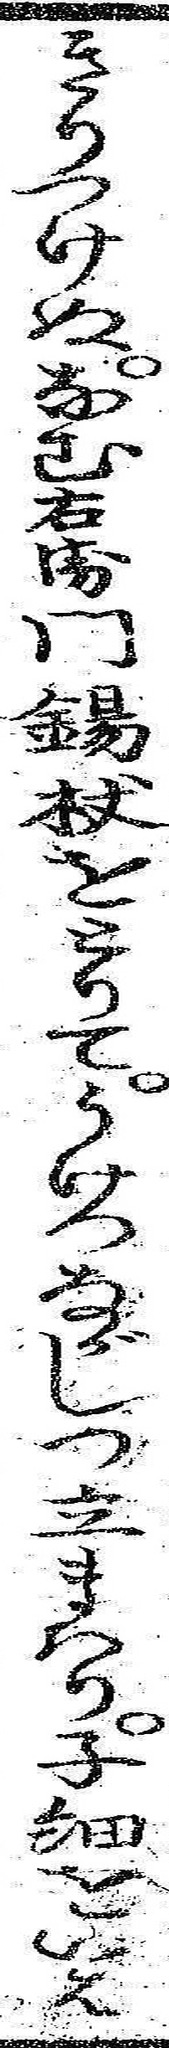きりつけぬ。なむ右衛門錫杖をとりて。うけつながしつ立まはり。子細をいは
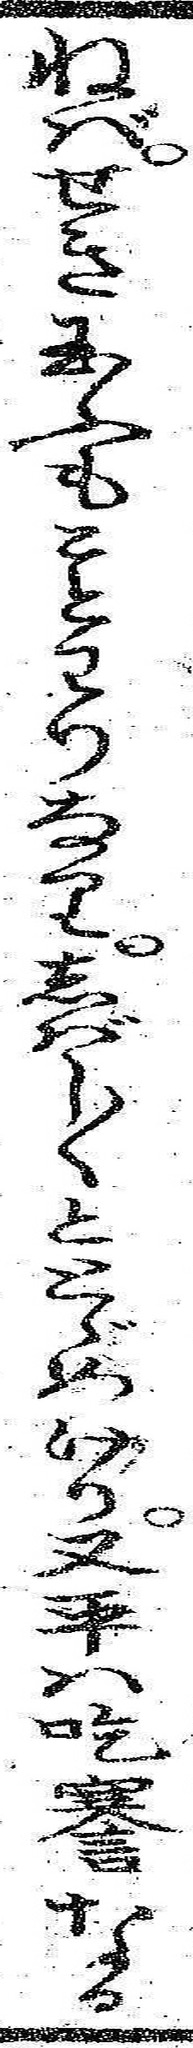ねば。せき玉ふもことわりなり。しばし〳〵ととゞめけり。又平は吃謇なる

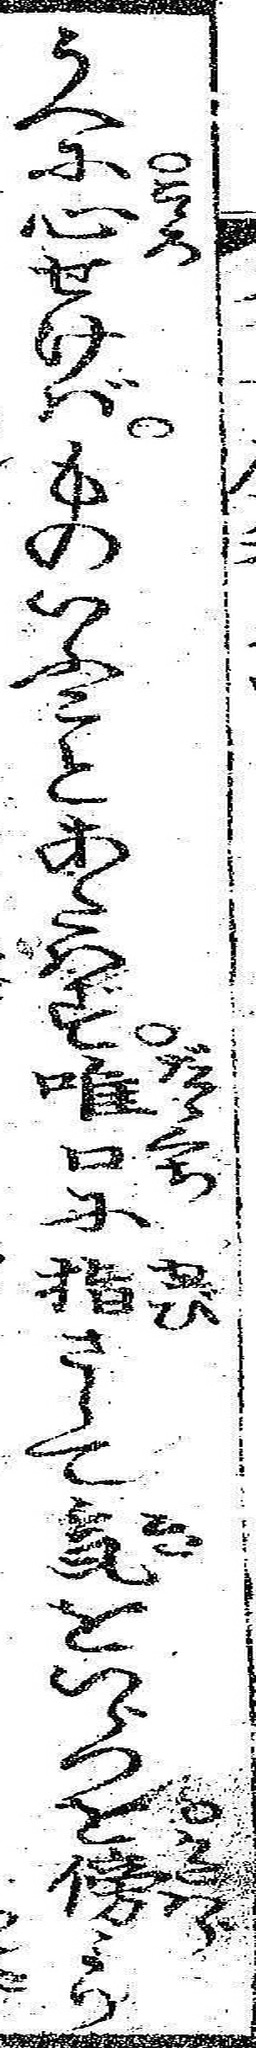うへに。心せけば。ものいふことあたはず。唯口に指さして気をいらつを。傍より
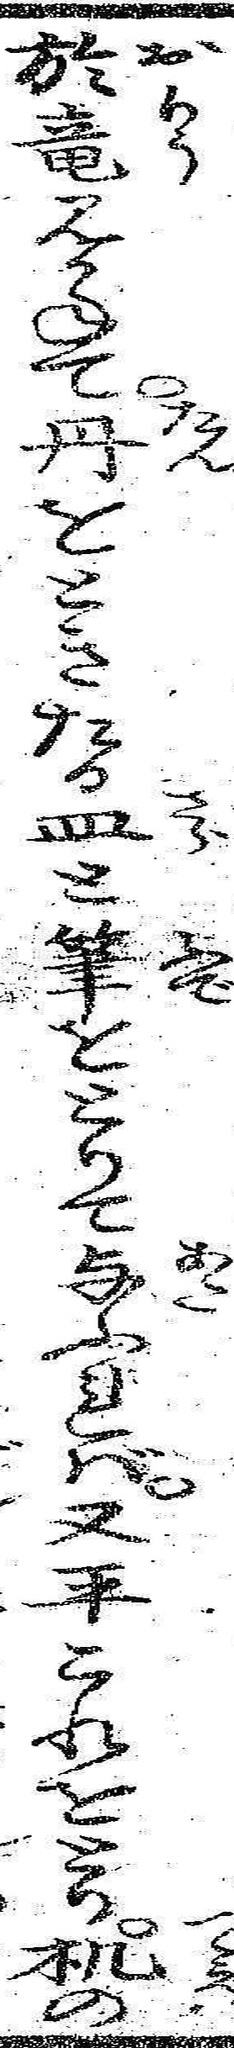於竜見かねて。丹をときたる皿と筆をとりて与ふれば。又平これをとり。机の
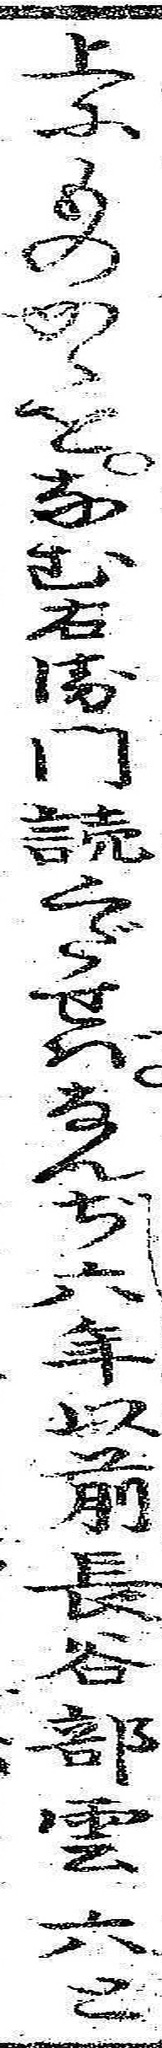上にものかくを。なむ右衛門読くだせば。なんぢ六年以前。長谷部雲六と
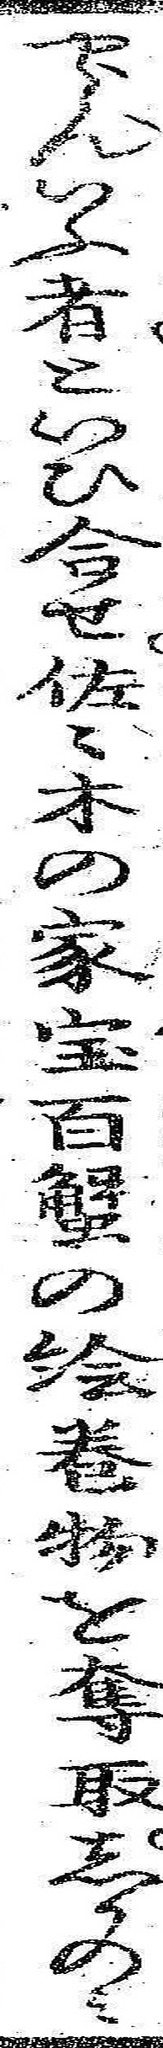やらんいふ者といひ合せ。佐々木の家宝百蟹の絵巻物を奪取。しかのみ
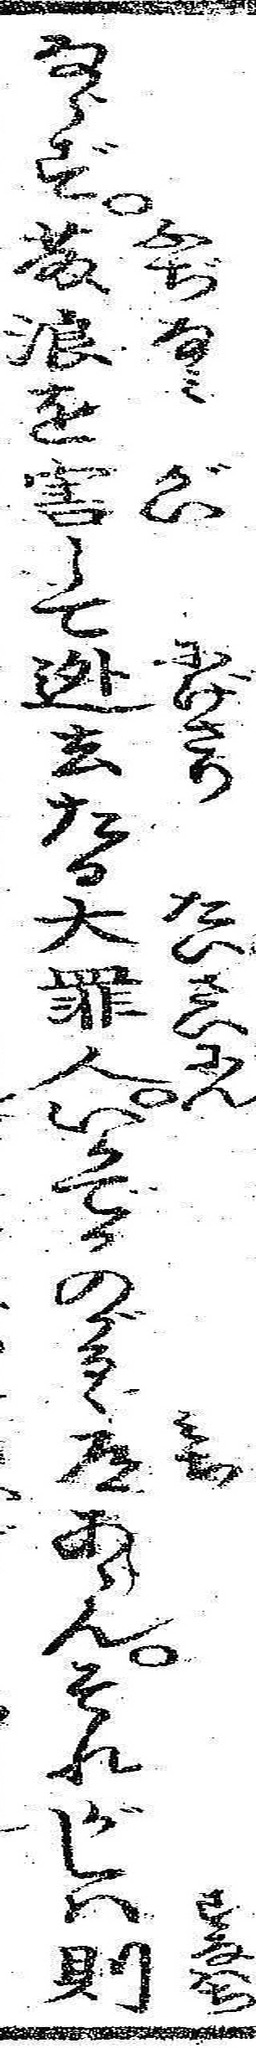ならず。藤浪を害して逃去たる大罪人。いかでかのがるゝ道あらん。それがしは則
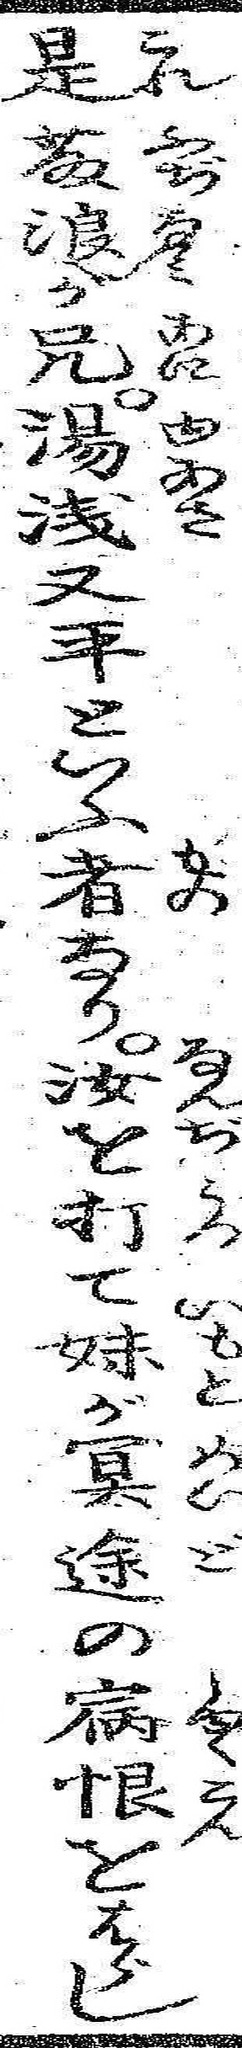是藤浪が兄湯浅又平といふ者なり。汝を打て妹が冥途の宿恨をはらし
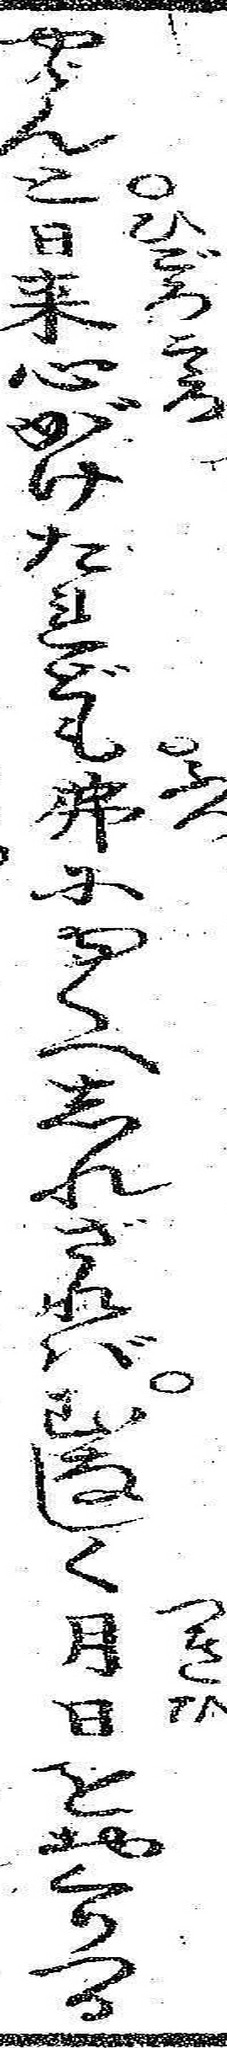やらんと。日来心がけたれども。弗にゆくへしれざれば。むなしく月日をおくりつる
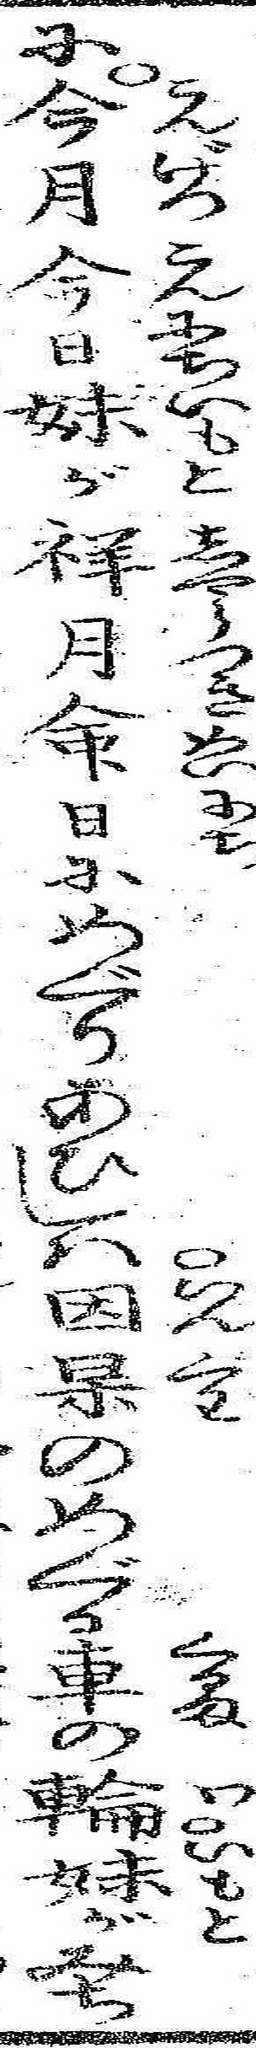に。今月今日妹が祥月命日にめぐりあひしは。因果のめぐる車の輪。妹がみち
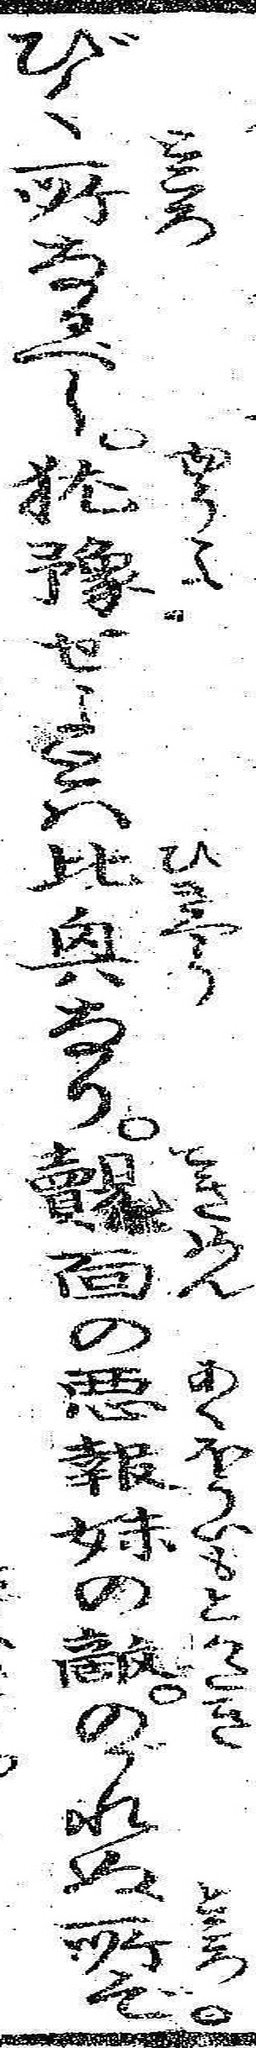びく所なるべし。猶予せよとは比興なり。覿面の悪報妹の敵。のがれぬ所ぞ。
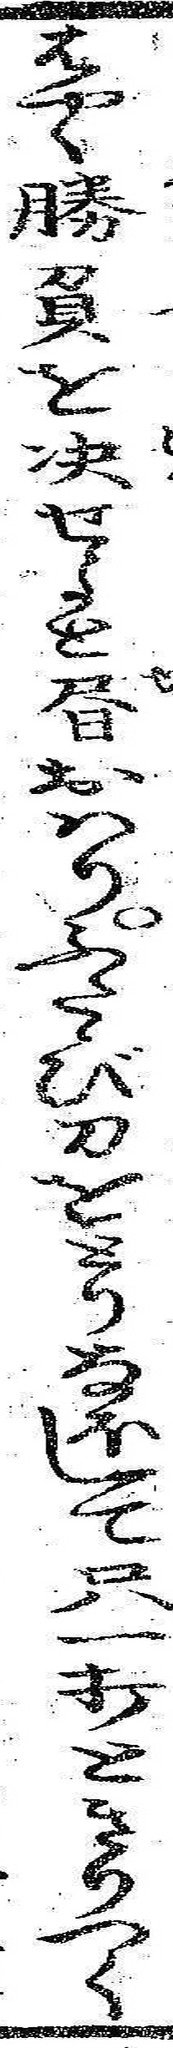はやく勝負を決せよと書おはり。ふたゝび刀をとりなほして。只一打ときりつく
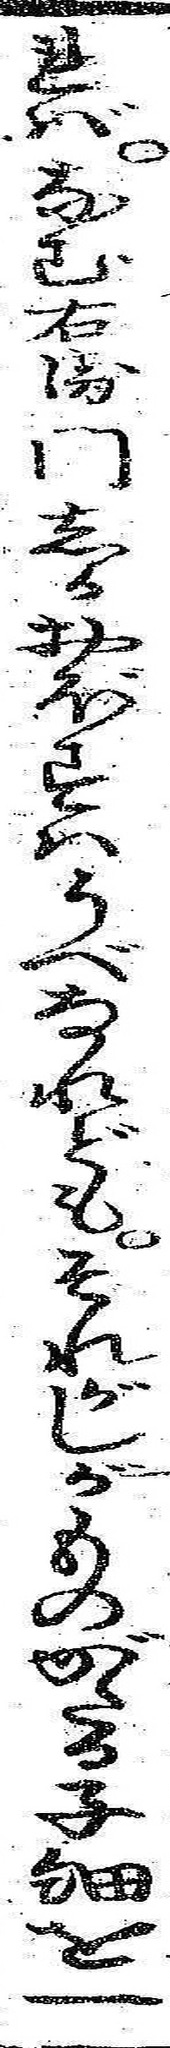れば。なむ右衛門しかおぼすはうべなれども。それがしがものがたる子細を一
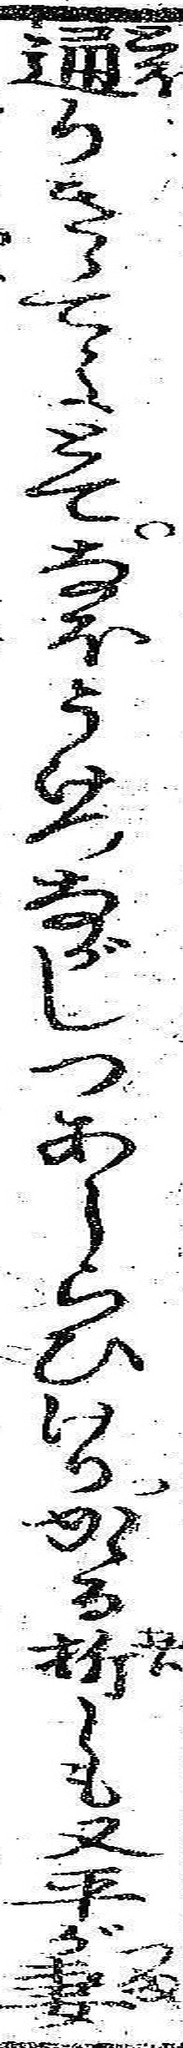通りきゝてよとて。なほうけつながしつあしらひけり。かゝる折しも又平が妻
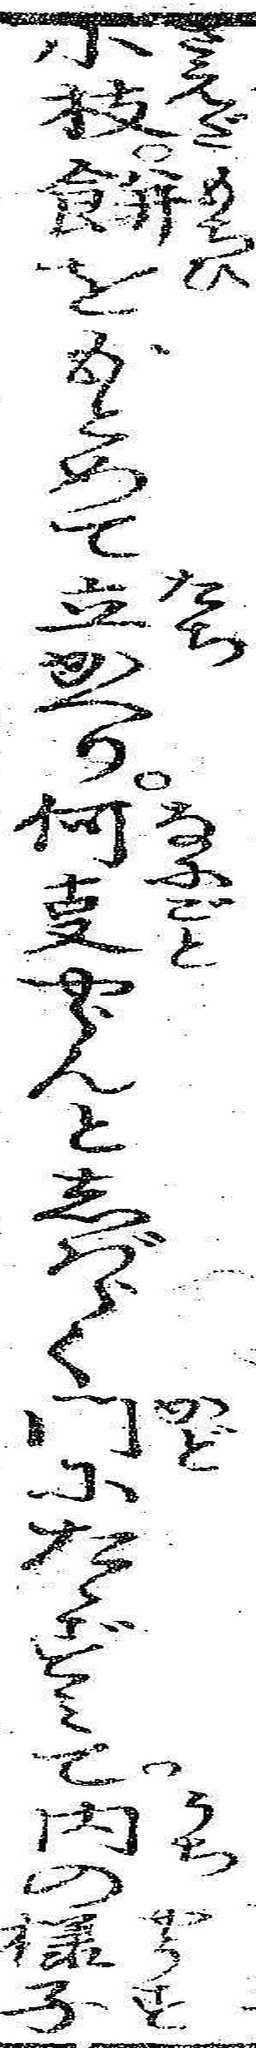小枝。餅をもとめて立かへり。何事やらんとしばらく門にたゝずみて。内の様子
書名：昔話稲妻表紙
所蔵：国文学研究資料館
